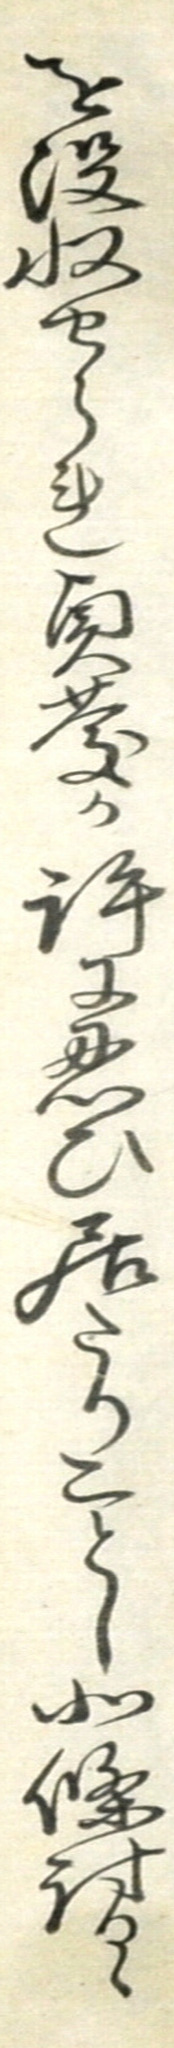を没収せられ貞慶か許に忍ひ居たりことし北条討るゝ
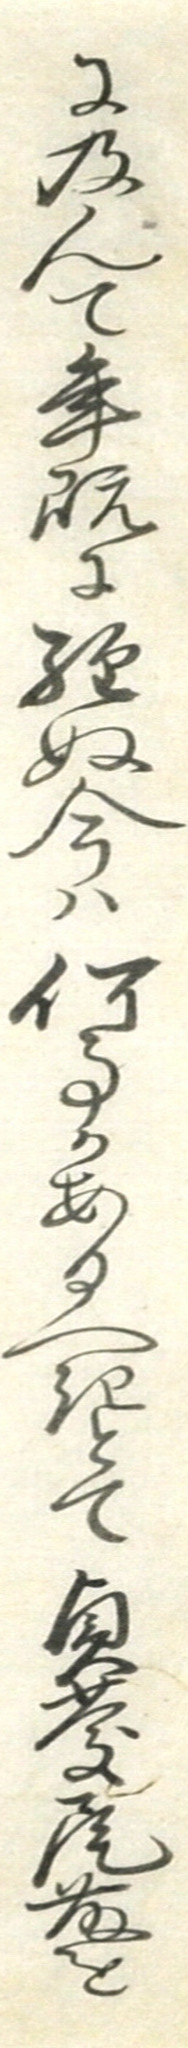に及んて年既に経ぬ今は何事かあるへきとて貞慶尾藤を
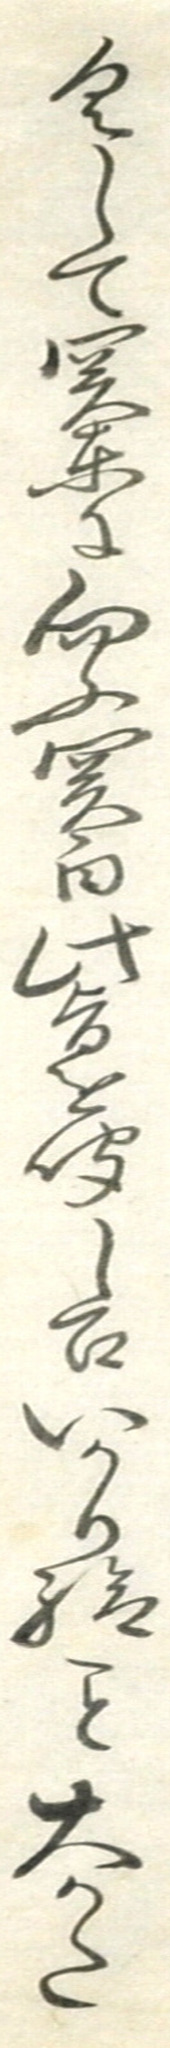具して関東に向ふ関白此旨を聞し召いかり給こと大かた
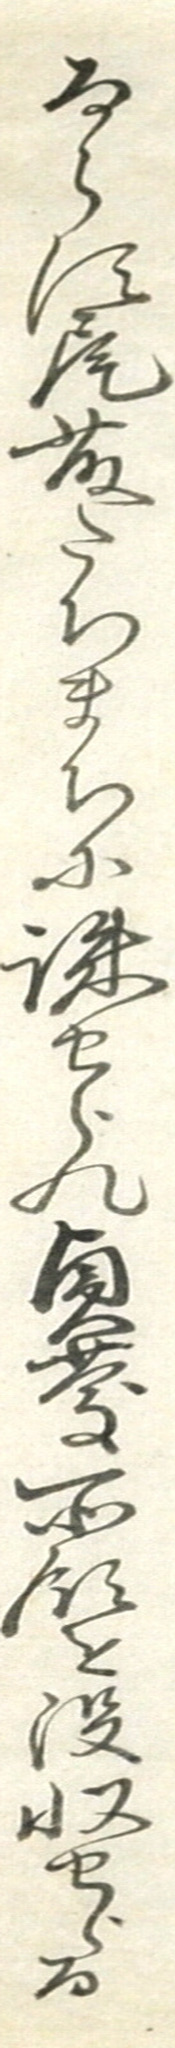ならす尾藤たちまちに誅せられ貞慶所領を没収せらる
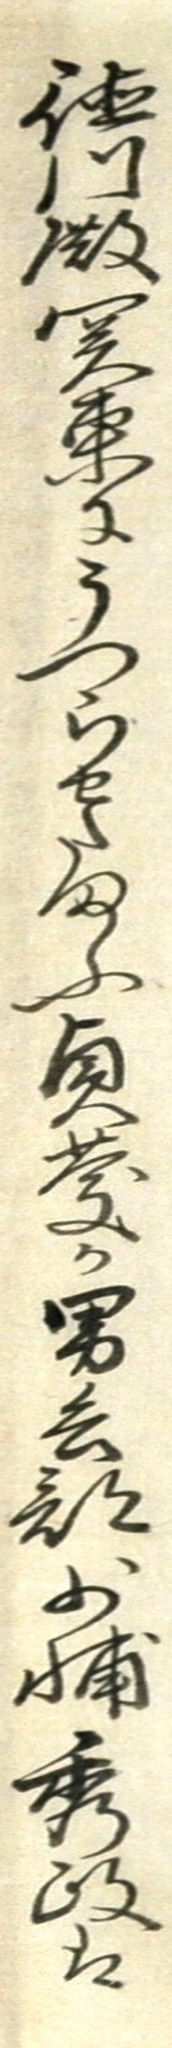徳川殿関東にうつらせたまふ貞慶か男兵部少輔秀政は

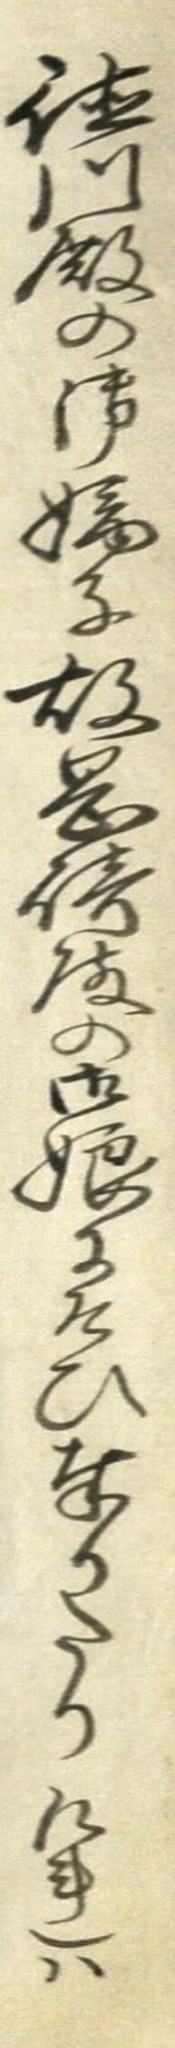徳川殿の御嫡子故岡崎殿の御娘にそひ奉りたりけれは
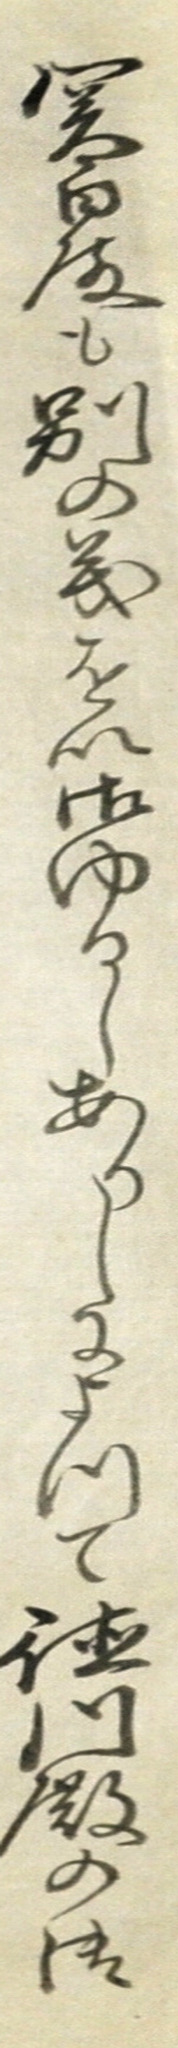関白殿も別の義を以御ゆるしありしによつて徳川殿の御
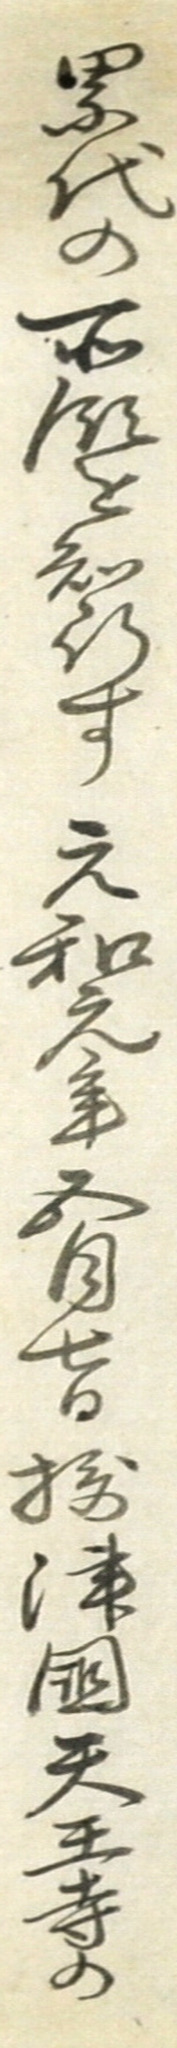累代の所領を知行す元和元年五月七日摂津国天王寺の
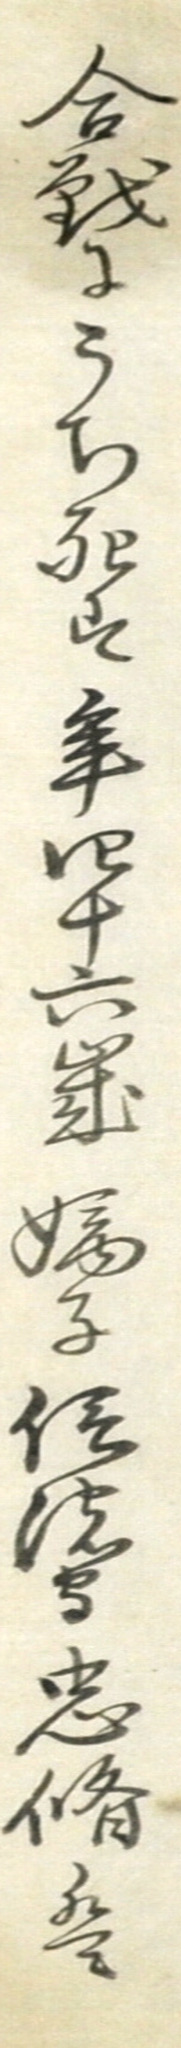合戦にうち死す年四十六歳嫡子信濃守忠脩は
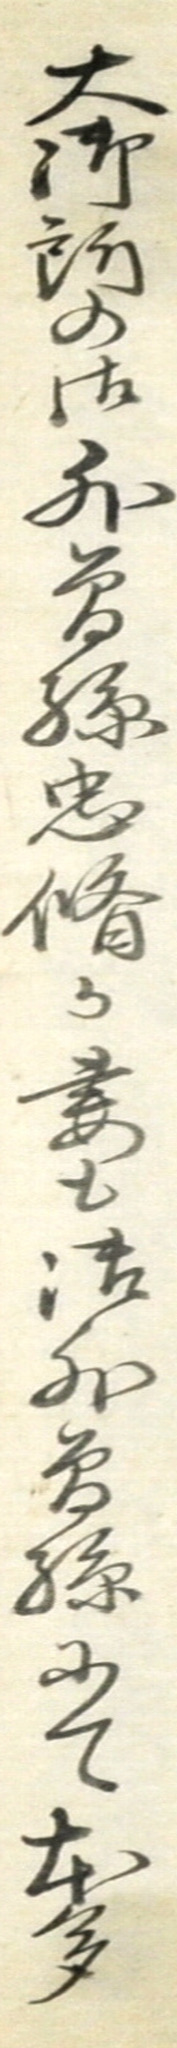大御所の御外曽孫忠脩か妻も御外曽孫にて本多
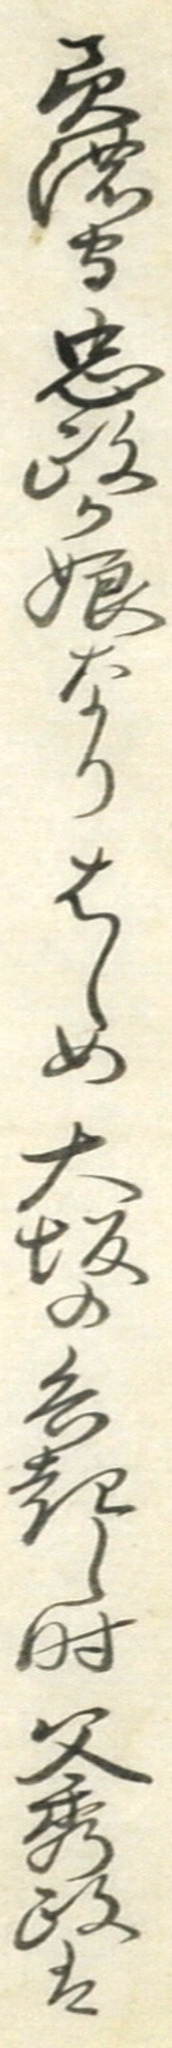美濃守忠政か娘なりはしめ大坂の兵起し時父秀政は
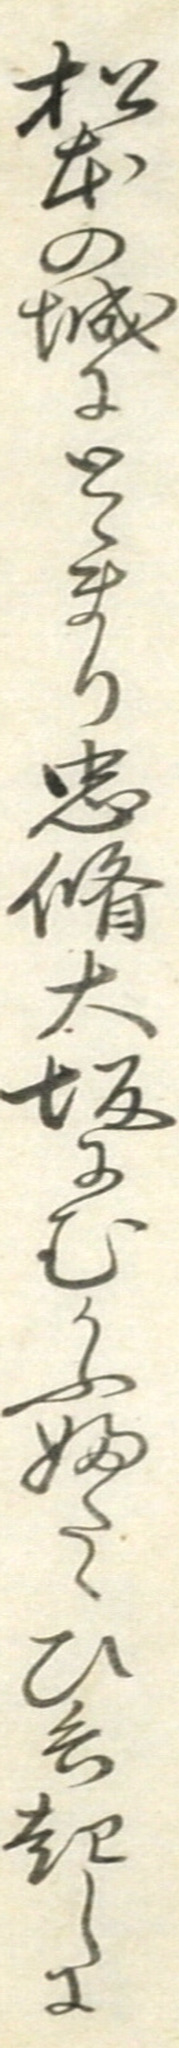松本の城にとゝまり忠脩大坂にむかふふたゝひ兵起しに
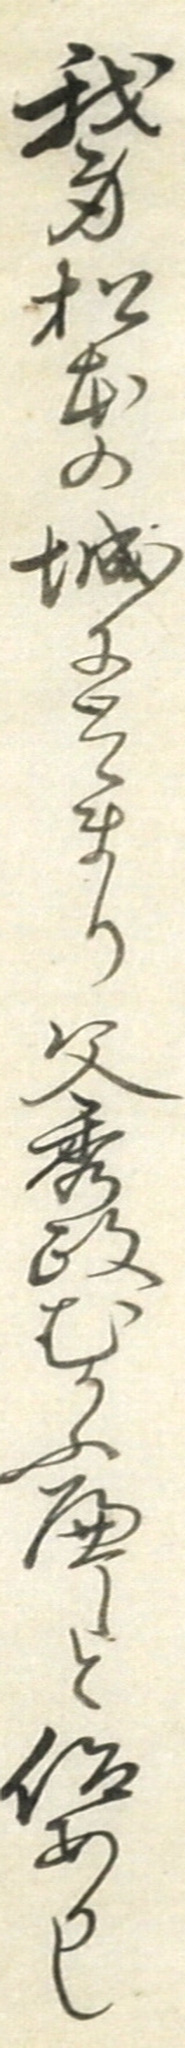我身松本の城にとゝまり父秀政むかふへしと仰ありし
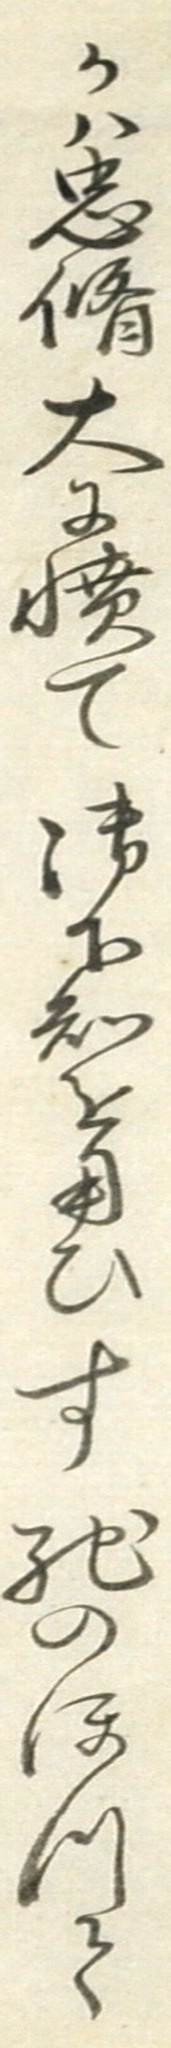かは忠脩大に憤て御下知を用ひす馳のほつて
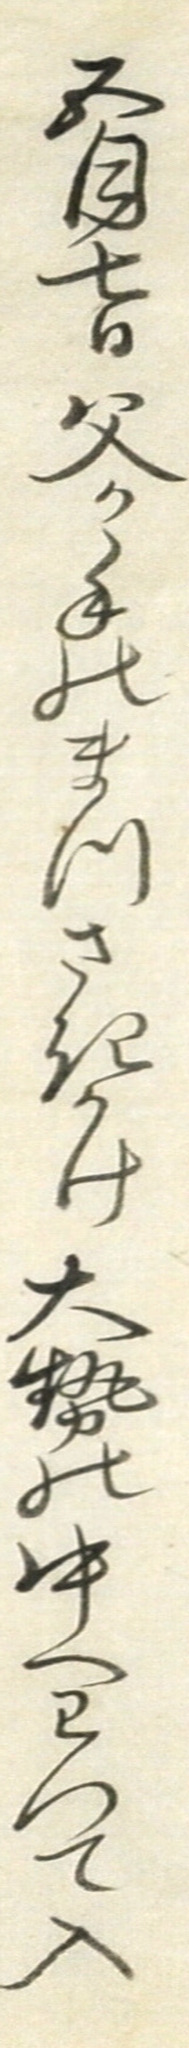五月七日父か手のまつさきかけ大勢の中へわつて入
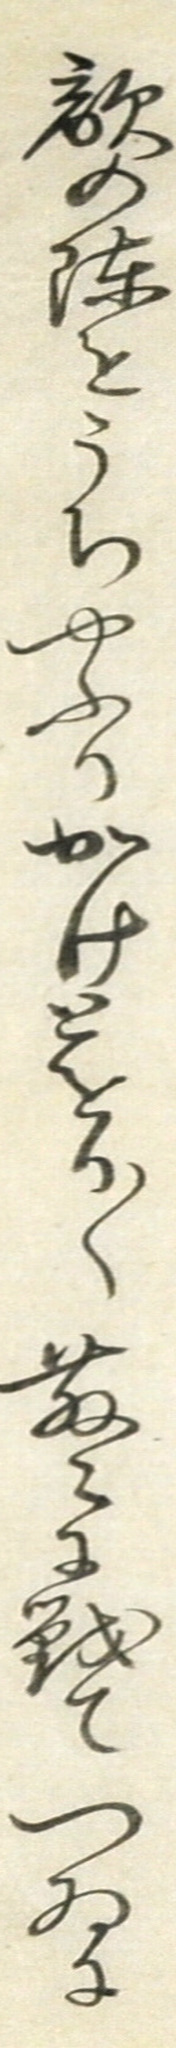敵の陣をうちやふりかけとをり〳〵散々に戦てつゐに
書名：藩翰譜（六）
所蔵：伊那市立高遠町図書館・合同会社AMANE
